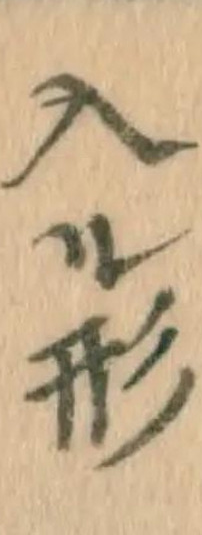入ル形
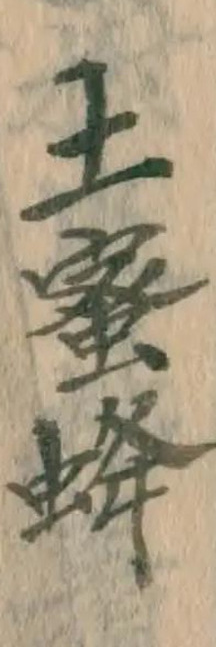土蜜蜂
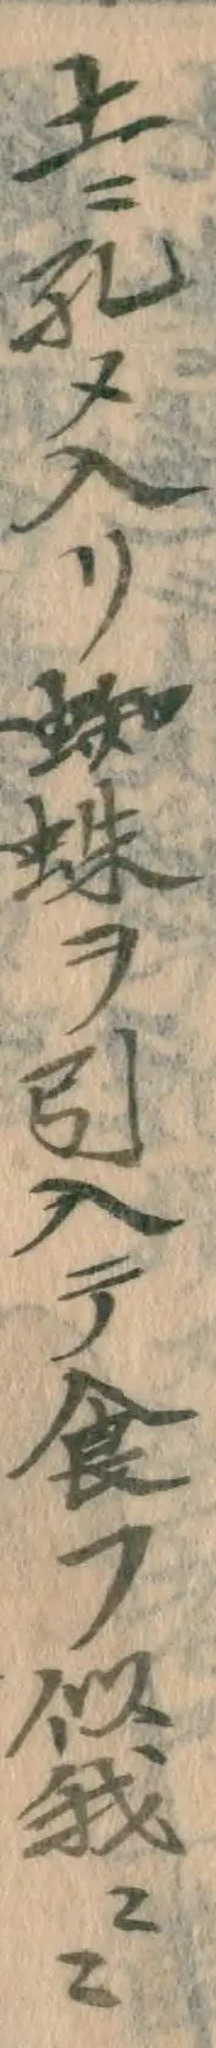土ニ孔シテ入リ蜘蛛ヲ引入テ食フ似我々々
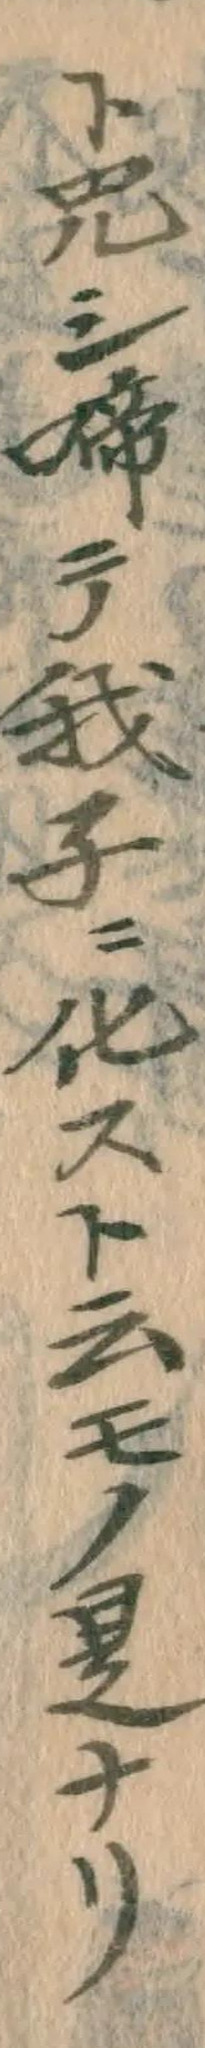ト咒シ啼テ我子ニ化スト云モノ是ナリ
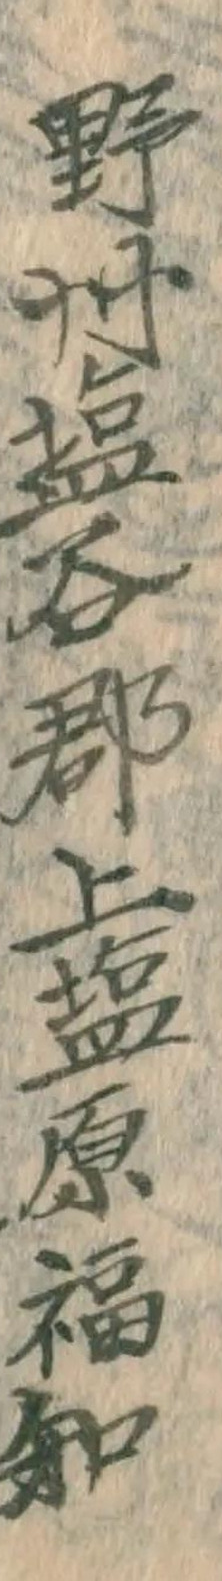野州塩谷郡上塩原福和
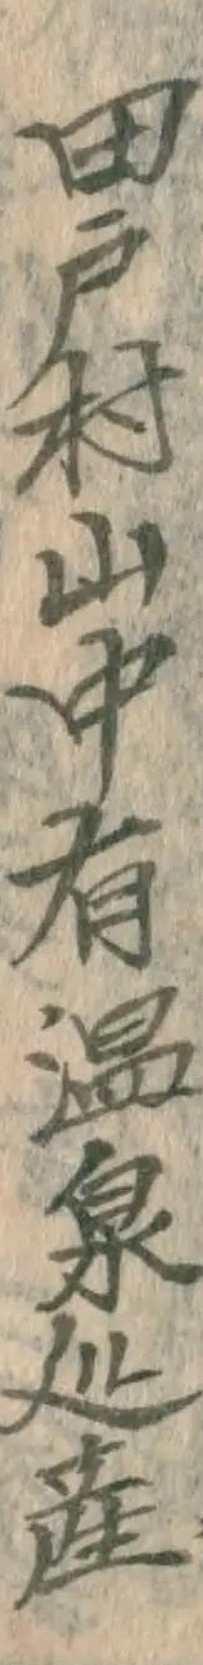田戸村山中有温泉処産

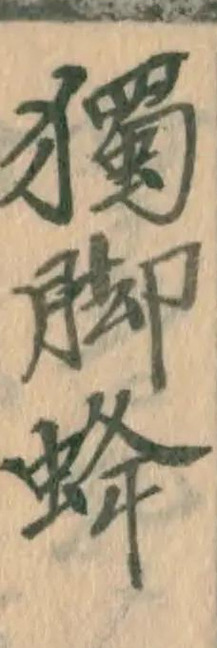獨脚蜂
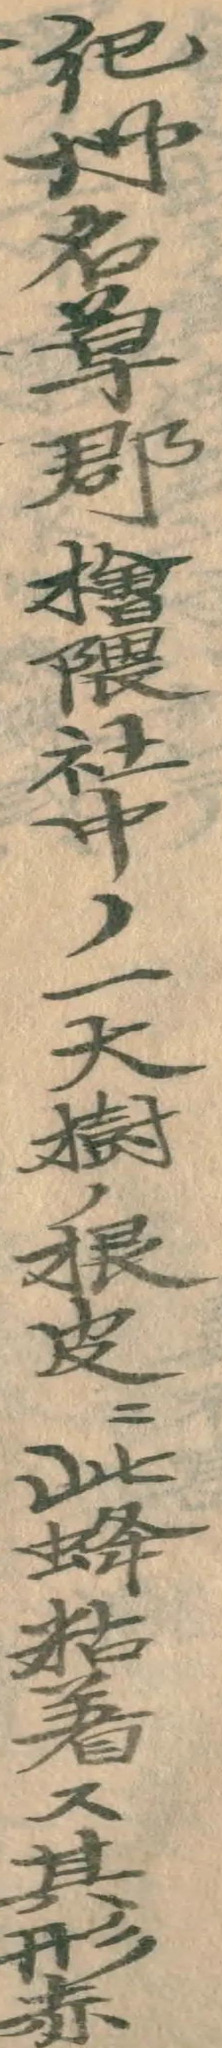紀州名草郡檜隈社中ノ一大樹ノ根皮ニ此蜂粘着ス其形赤
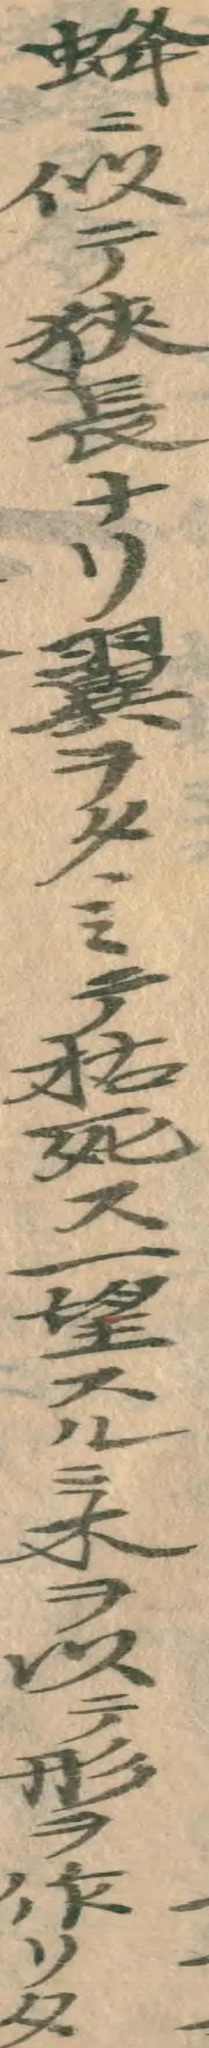蜂ニ似テ狭長ナリ翼ヲタヽミテ枯死ス一望スルニ木ヲ以テ形ヲ作リタ
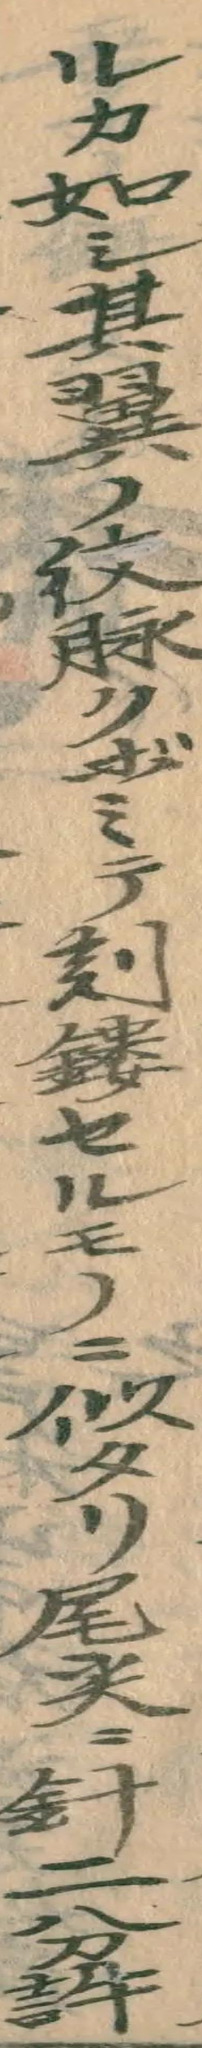ルカ如シ其翼ノ紋脉クボミテ刻鏤セルモノニ似タリ尾尖ニ針二分許
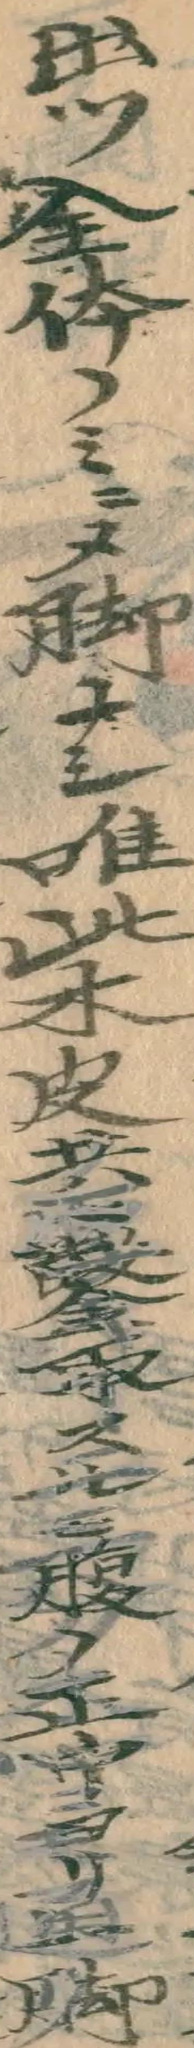出ツ全体ノミニシテ足ナシ唯此木皮共ニ鋻殊取スルニ腹ノ正中ヨリ一脚
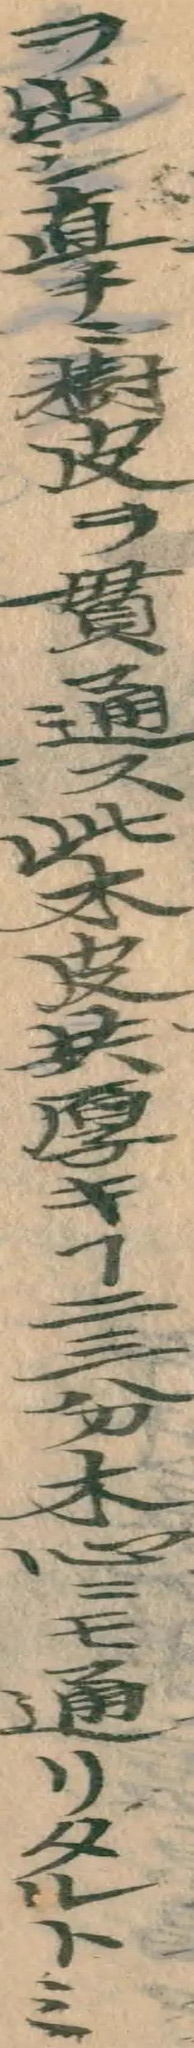ヲ出シ直チニ樹皮ヲ貫通ス此木皮厚キコト二三分木心ニモ通リタルトミ
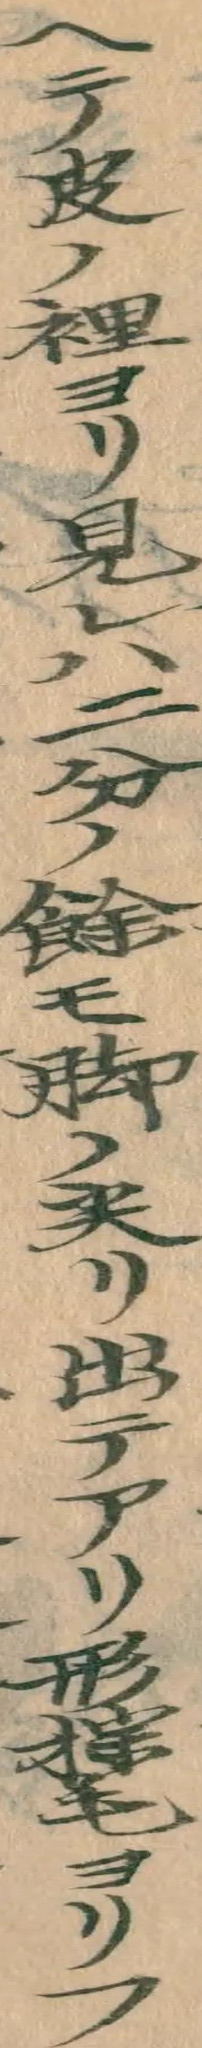ヘテ皮ノ裡ヨリ見レハ二分ノ餘モ脚ノ尖リ出テアリ形棕毛ヨリフ
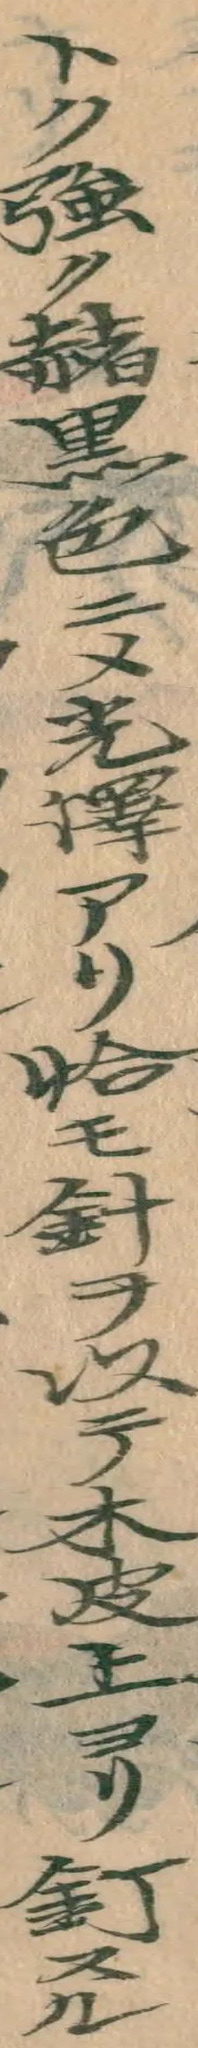トク強ク赭黒色ニシテ光澤アリ恰モ針ヲ以テ木皮上ヨリ釘スル
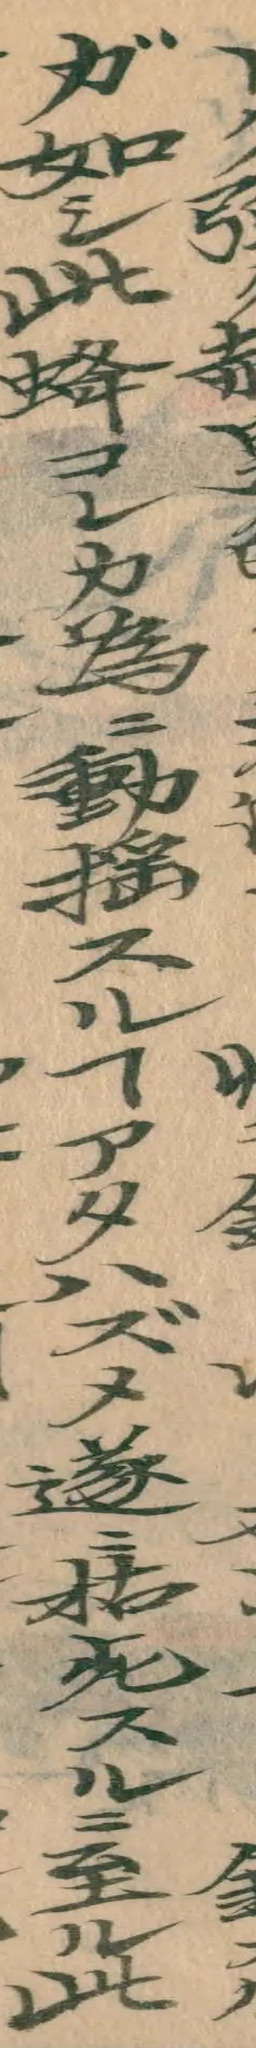ガ如シ此蜂コレカ為ニ動揺ススルコトアタハズシテ遂ニ枯死スルニ至ル此
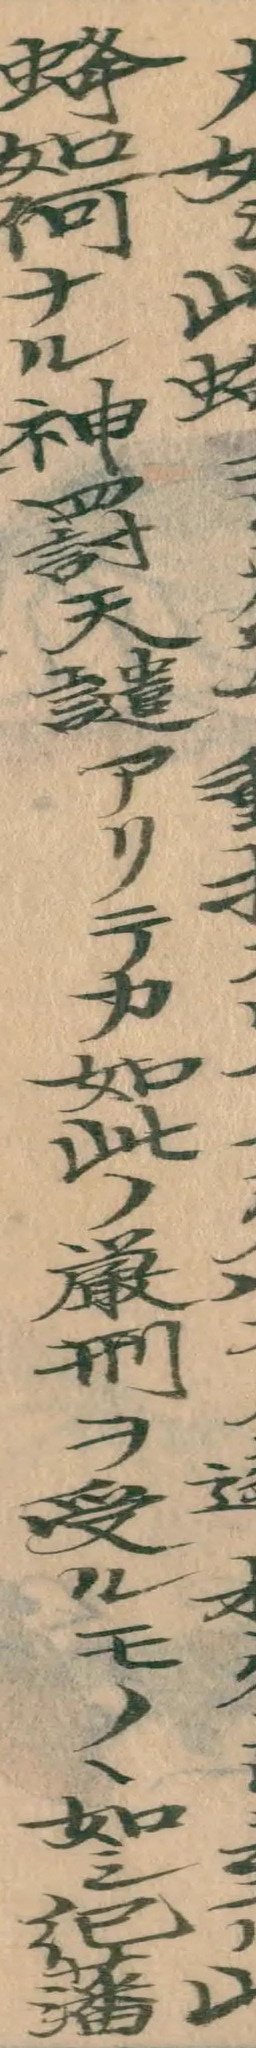蜂如何ナル神罰天譴アリテカ如此ノ厳刑ヲ受ルモノヽ如シ紀藩
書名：千蟲譜 3巻. [2]
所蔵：国立国会図書館 National Diet Library, JAPAN
